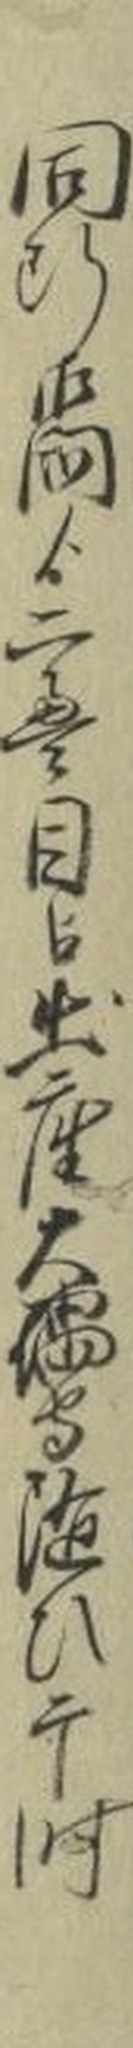同断御間ゟ二畳目え出座大隅守随ひ于時
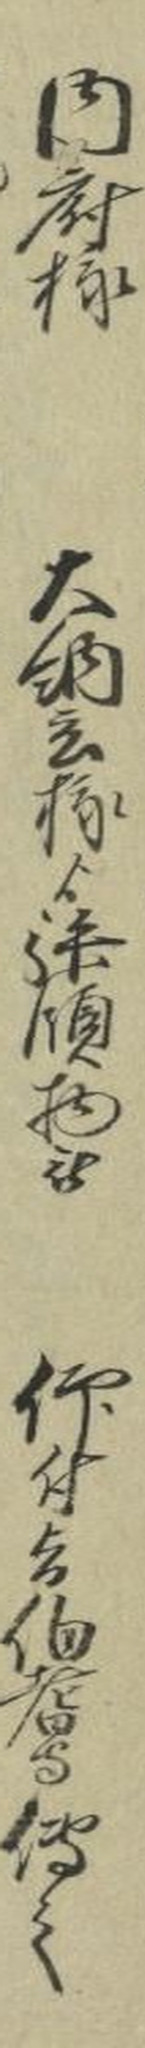内府様大納言様縁ゟ拝領物被仰付旨伯耆守伝之
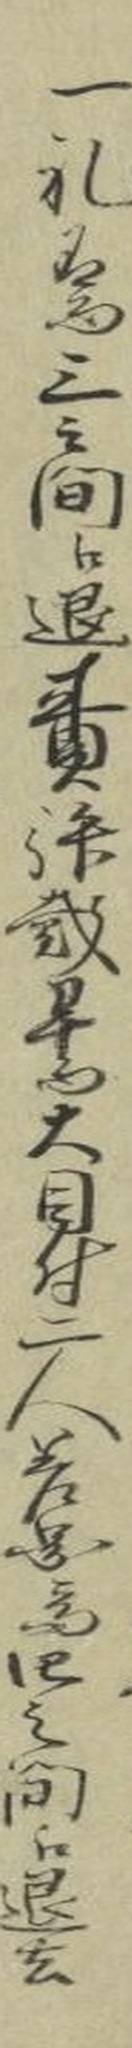一礼有て三之間え退賚拝戴畢て大目付二人差図にて四之間え退去
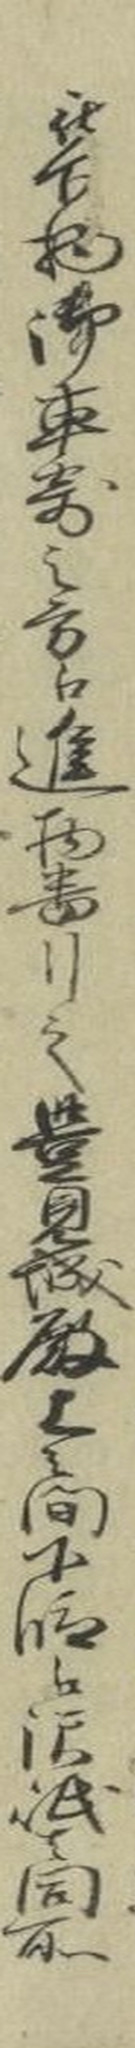被下物御車寄之方え進物番引之豊見城殿上之間下段え沢岻は同所
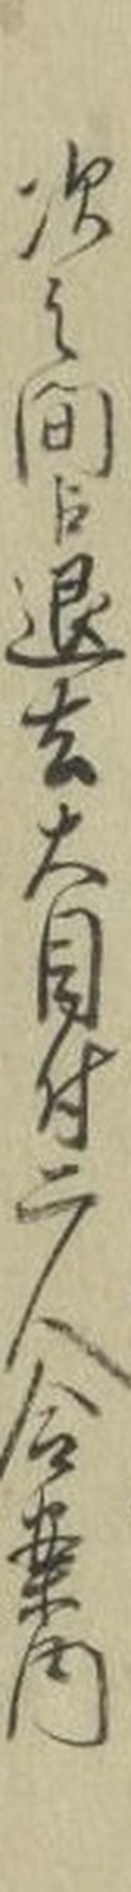次之間え退去大目付二人令案内
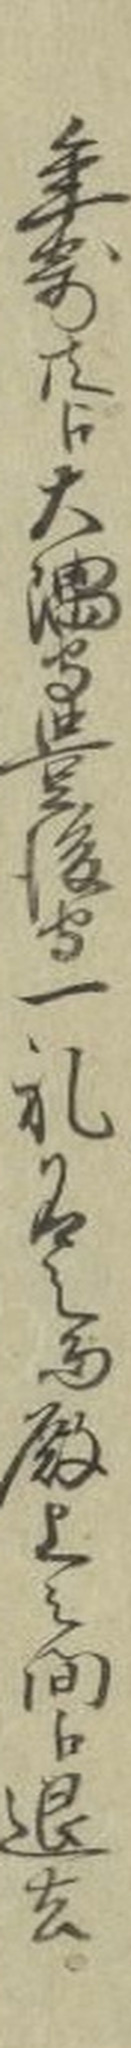一年寄共え大隅守豊後守一礼有之て殿上之間え退去
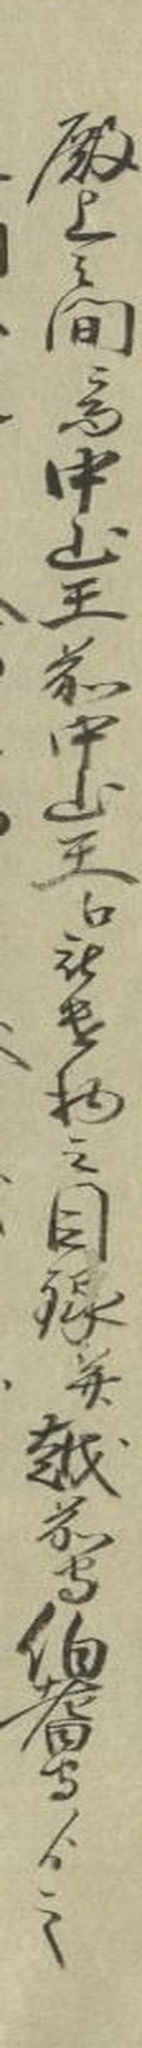一殿上之間にて中山王前中山王え被遣物之目録并越前守伯耆守ゟ之
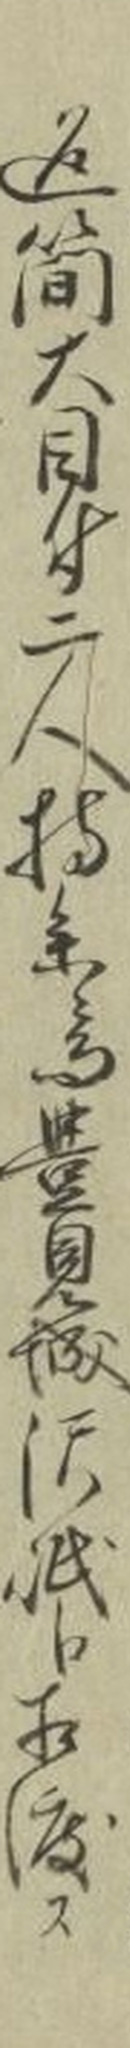返簡大目付二人持参にて豊見城沢岻え相渡す
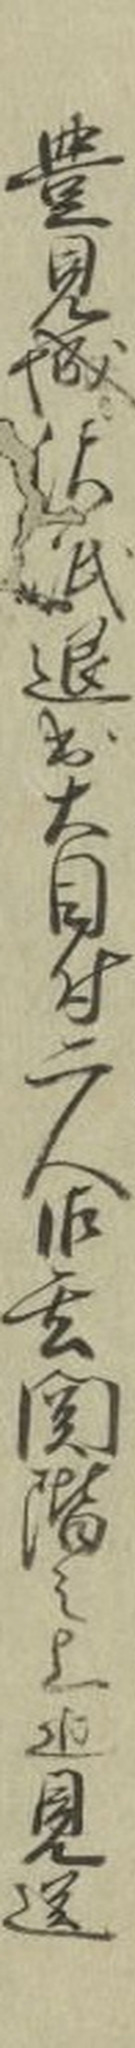一豊見城沢岻退出大目付二人御玄関階之上迄見送
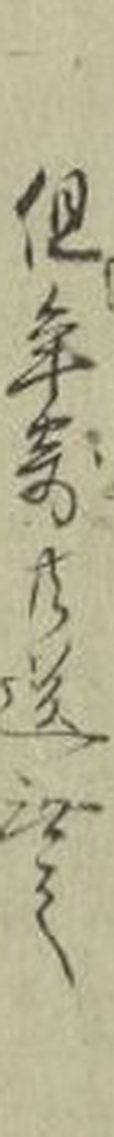但年寄共送無之
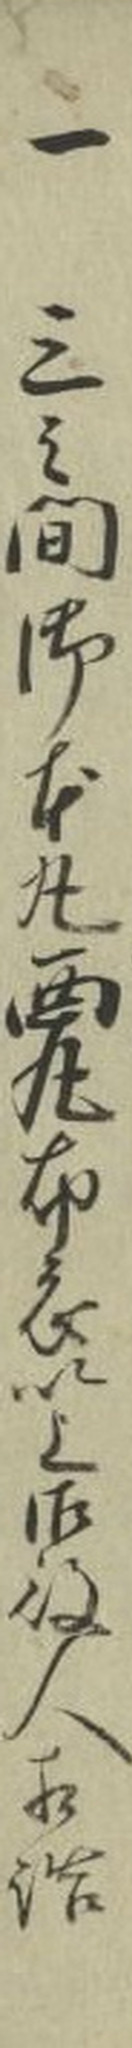一三之間御本丸西丸布衣以上御役人相詰
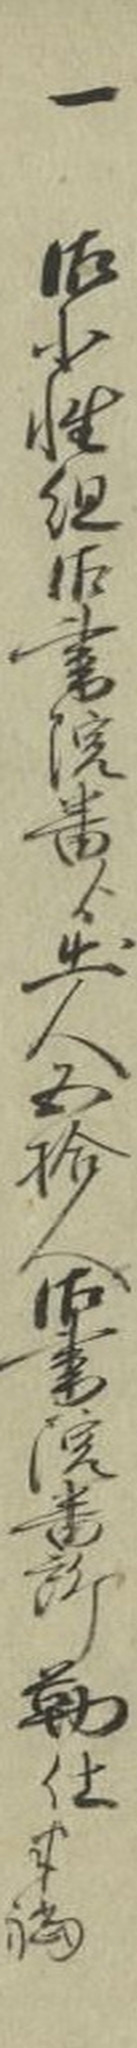一御小性組御書院番ゟ出人五拾人御書院番所勤仕半襠
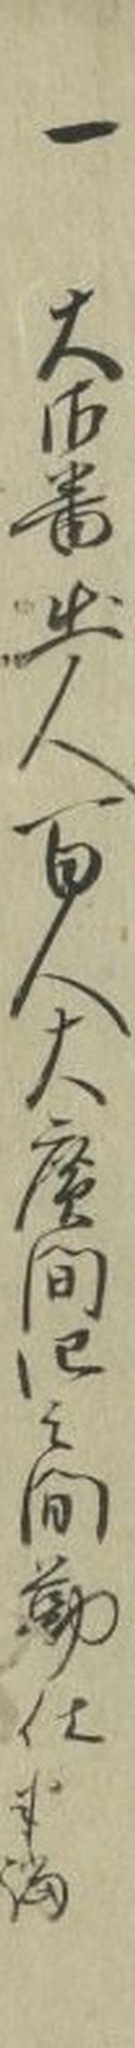一大御番出人百人大広間四之間勤仕半襠

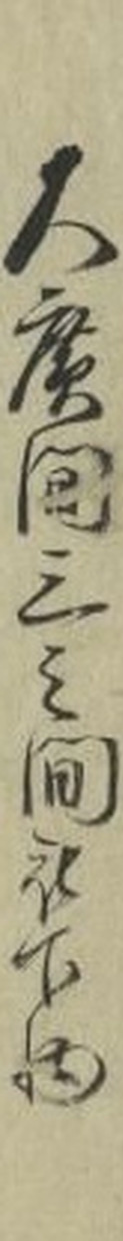大広間三之間被下物
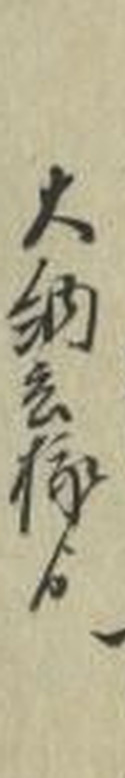大納言様ゟ
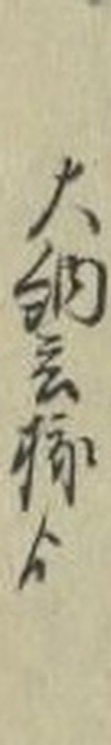大納言様ゟ
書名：天保三壬辰年琉球人参府之節勤方書留
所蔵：University of the Ryukyus Library
